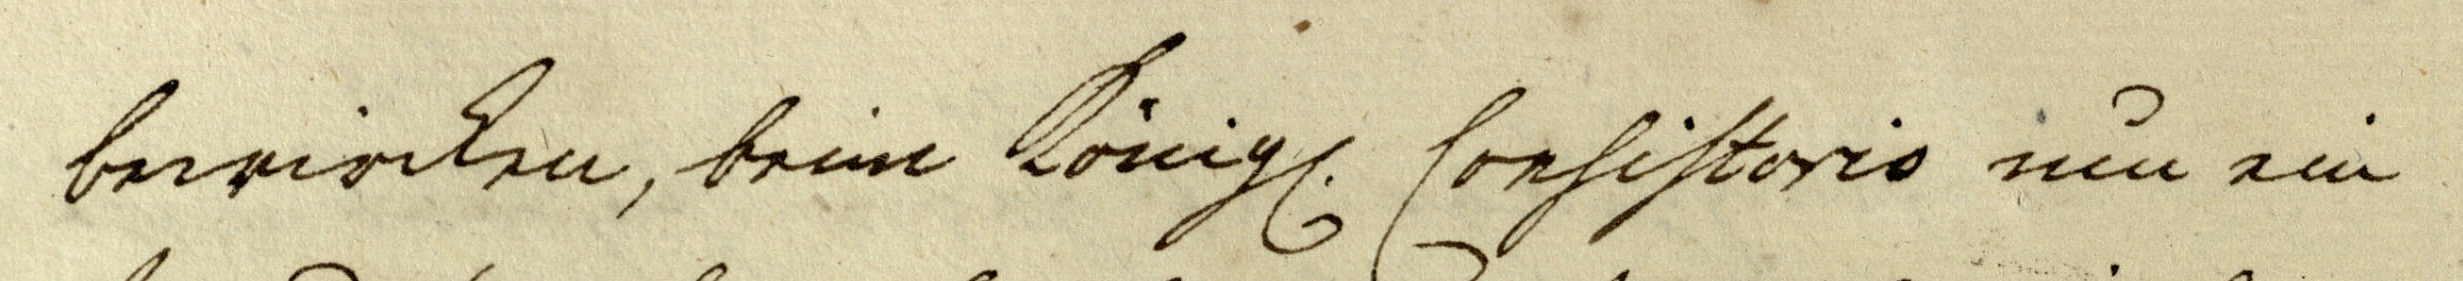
bewirken, beim Königl. Consistorio um ein
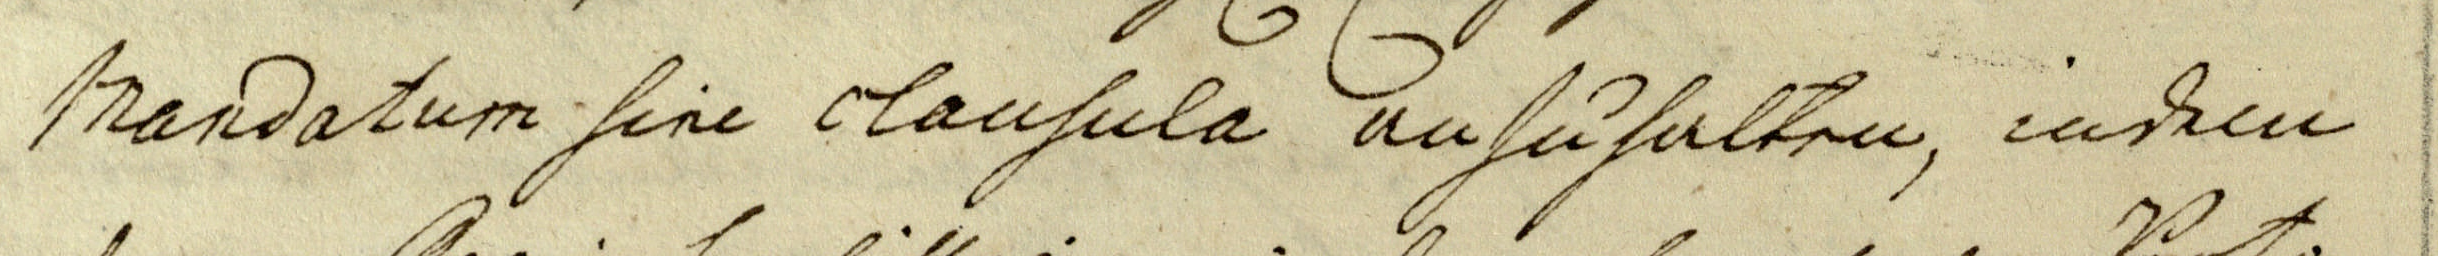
Mandatum sine clausula anzuhalten, indem
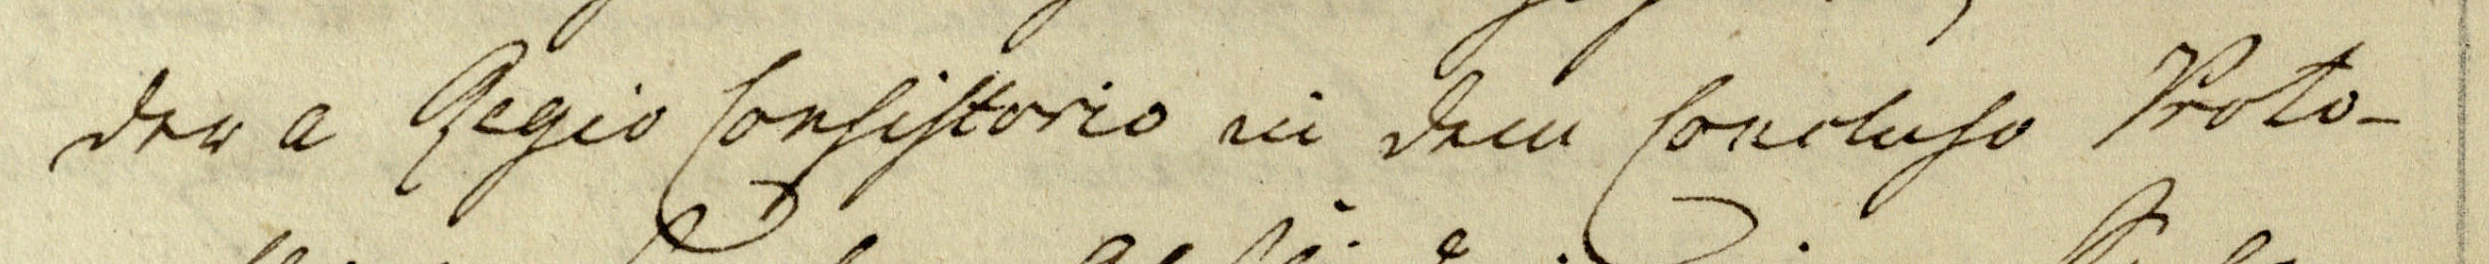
der a Regio Consistorio in dem Concluso Proto¬
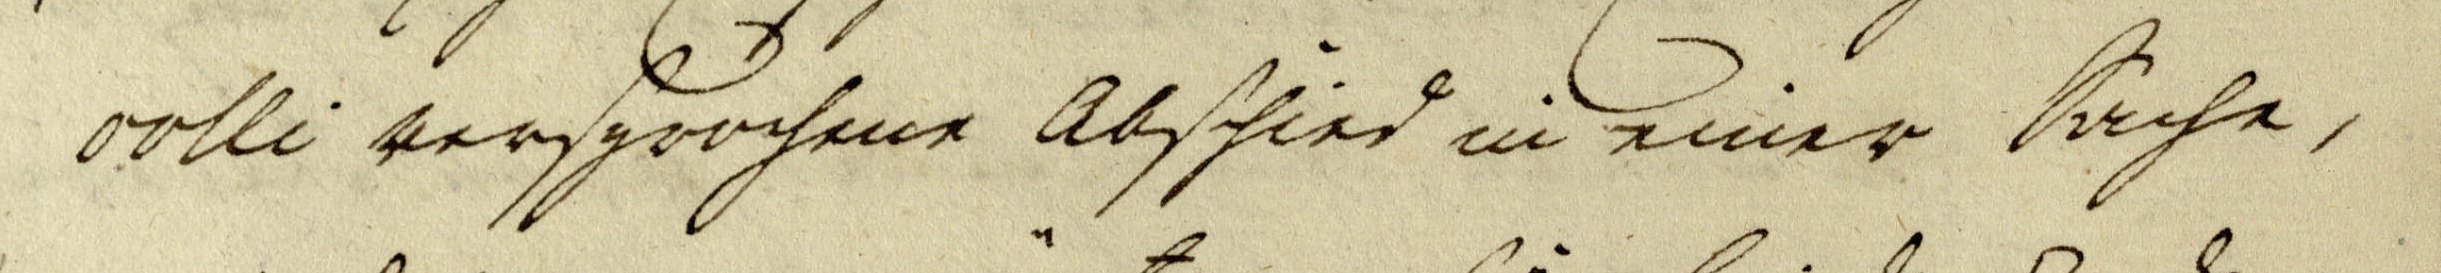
colli versprochene Abschied in einer Sache,
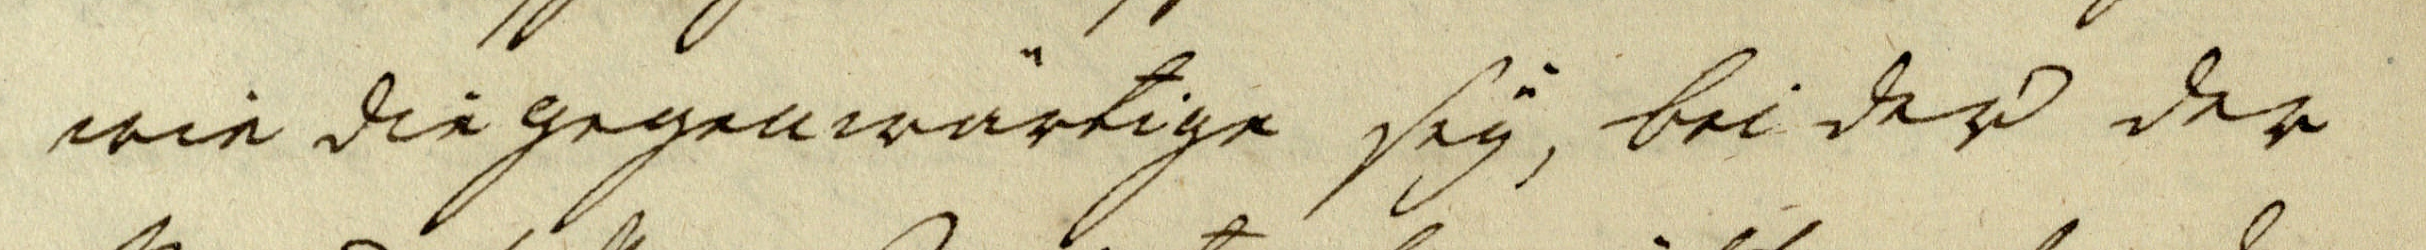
wie die gegenwärtige seÿ, bei der der
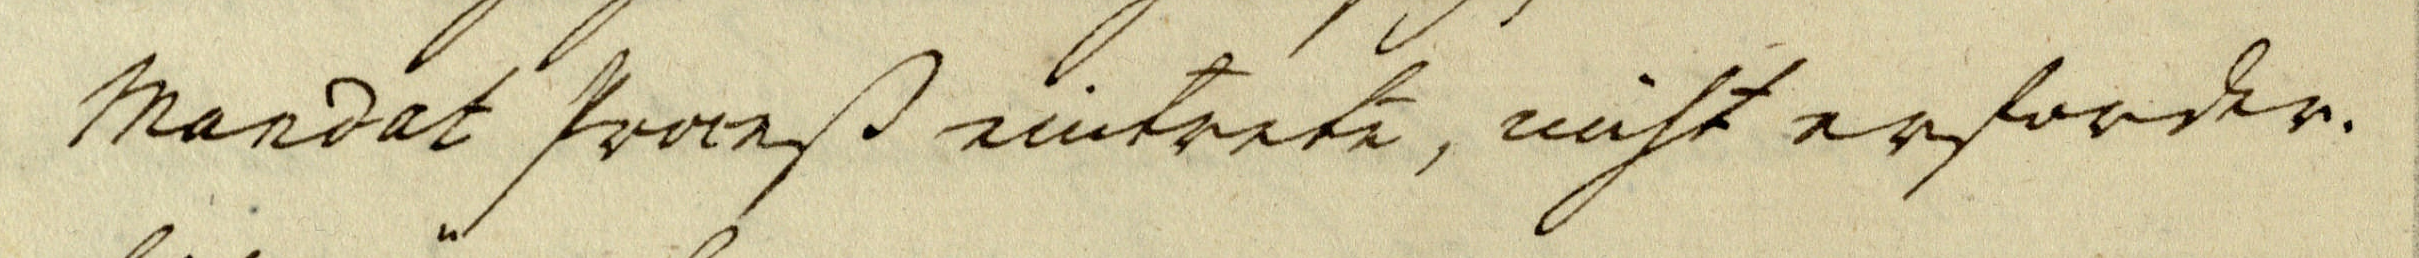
Mandat Proceß eintrete, nicht erforder¬
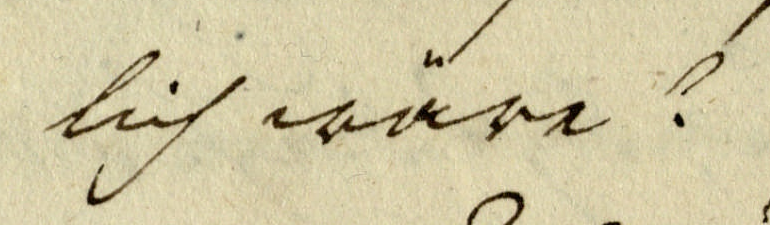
lich wäre?
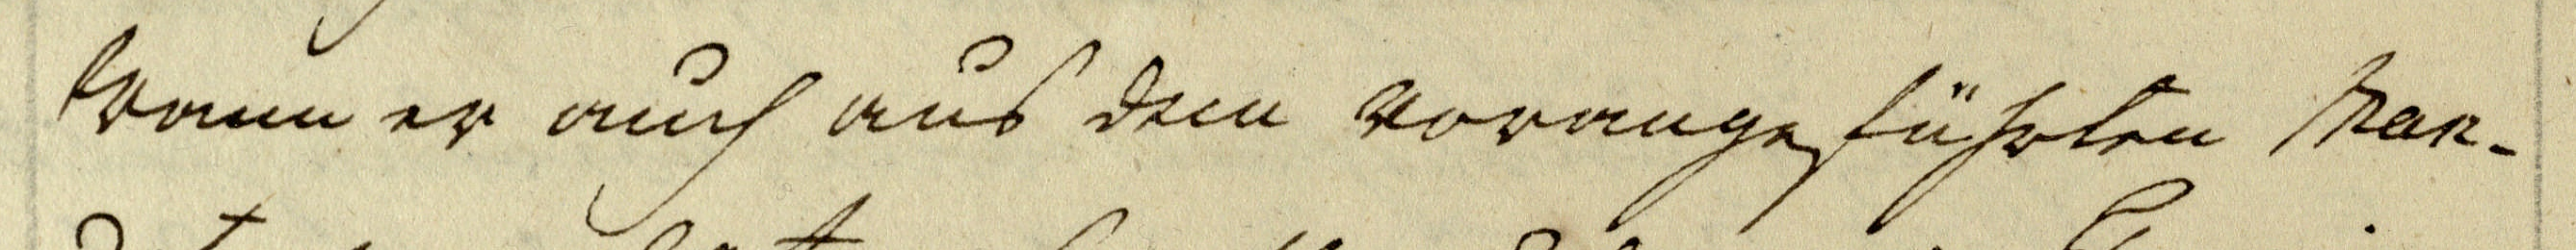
Wann er auch aus dem vorangeführten Man¬
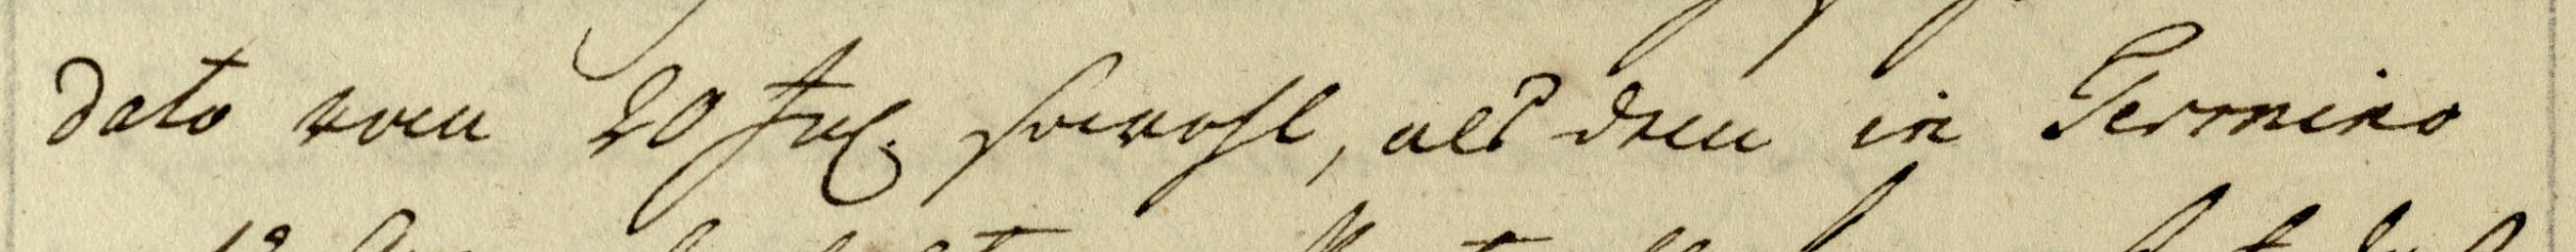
dato vom 20 Jul sowohl, als dem in Termino
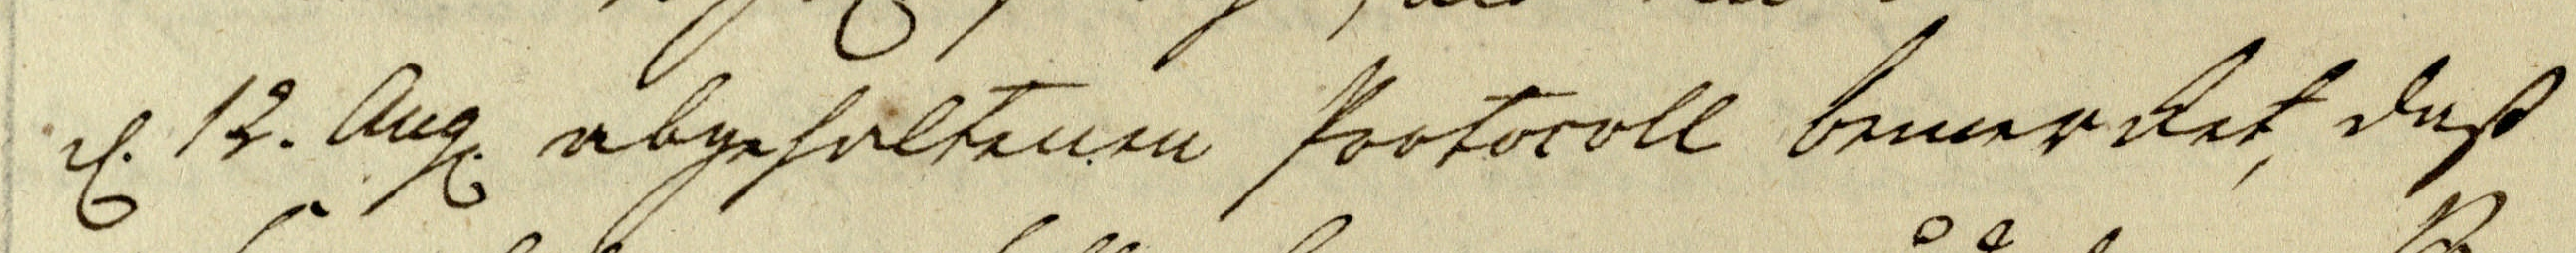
d. 12. Aug. abgehaltenen Protocoll bemercket, daß
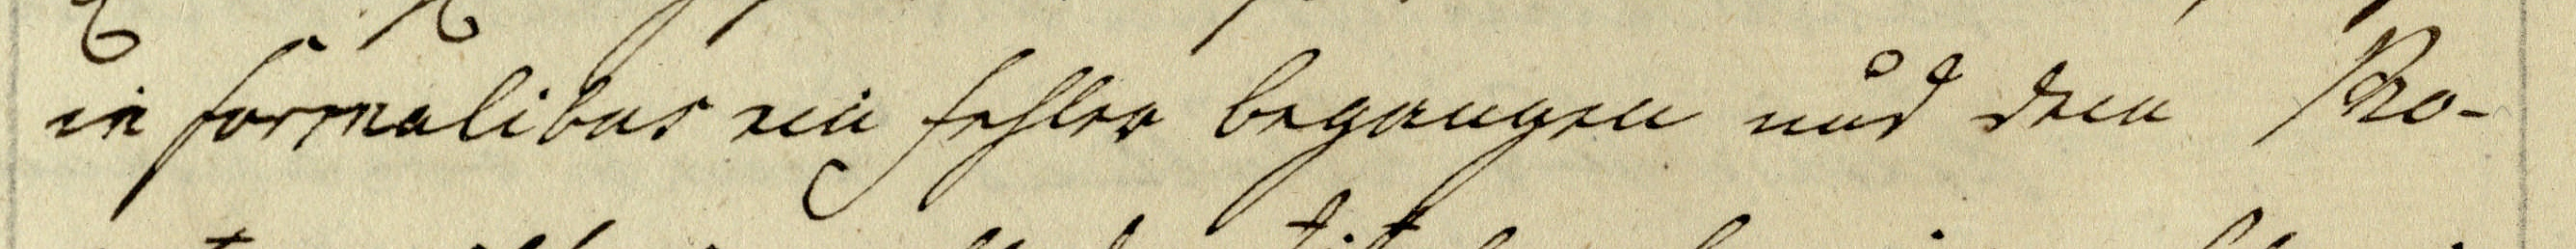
in formalibus ein Fehler begangen und dem Pro¬
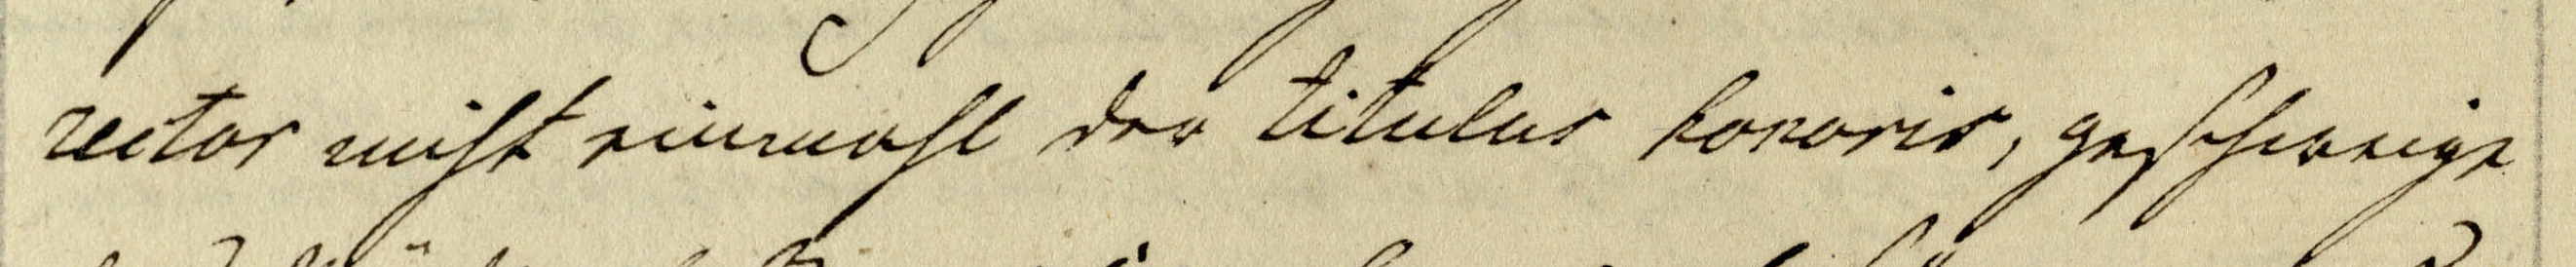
rector nicht einmahl der titulus honoris, geschweige
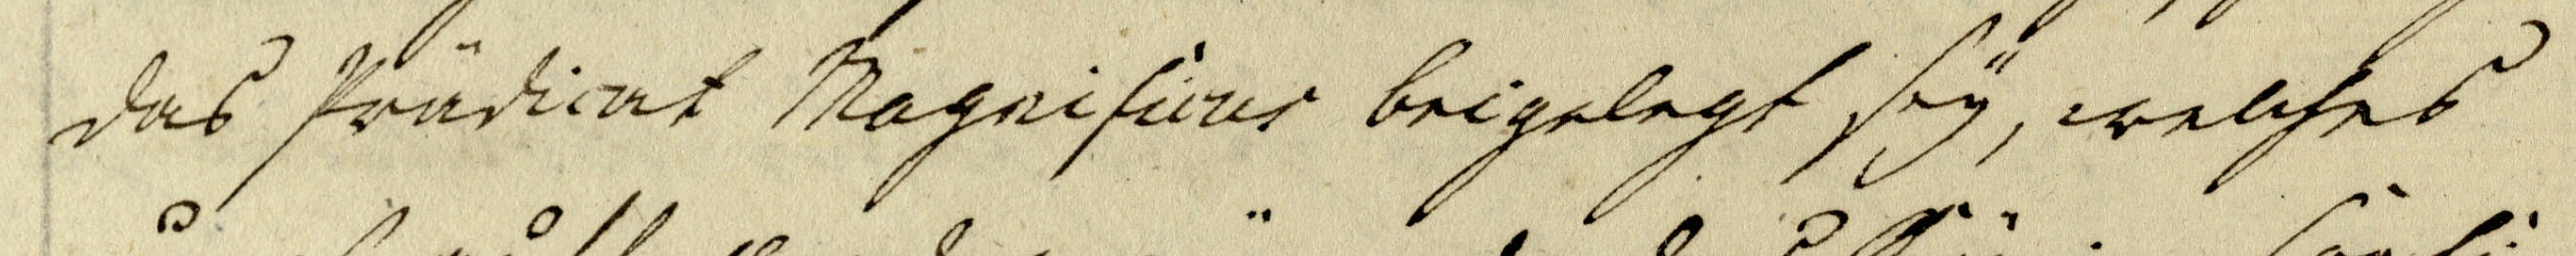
das Prädicat Magnificus beigelegt seÿ, welches
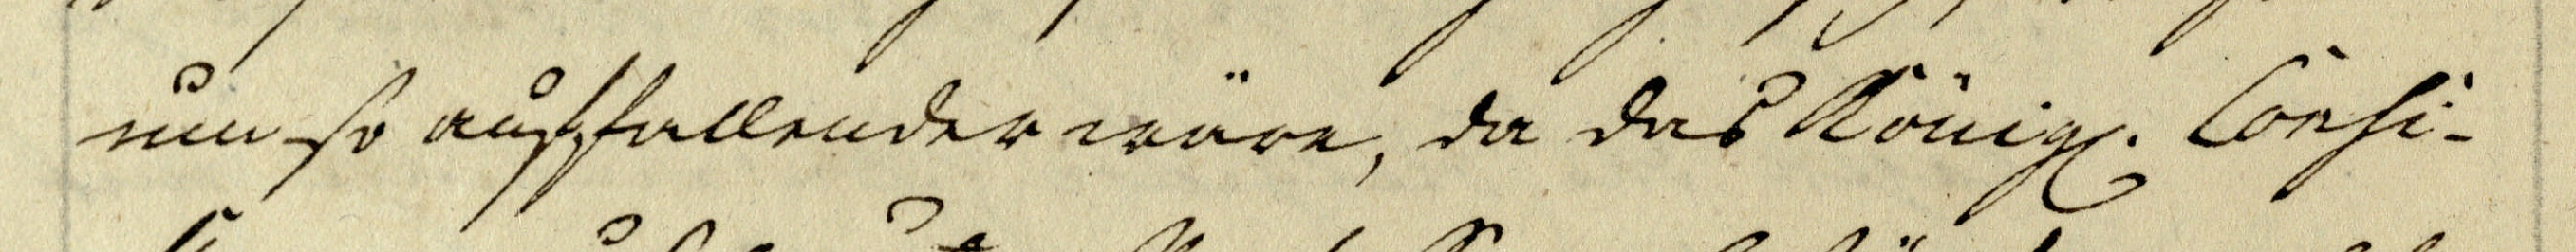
um so auffallender wäre, da das Königl. Consi¬
